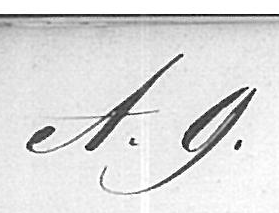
A. 9.
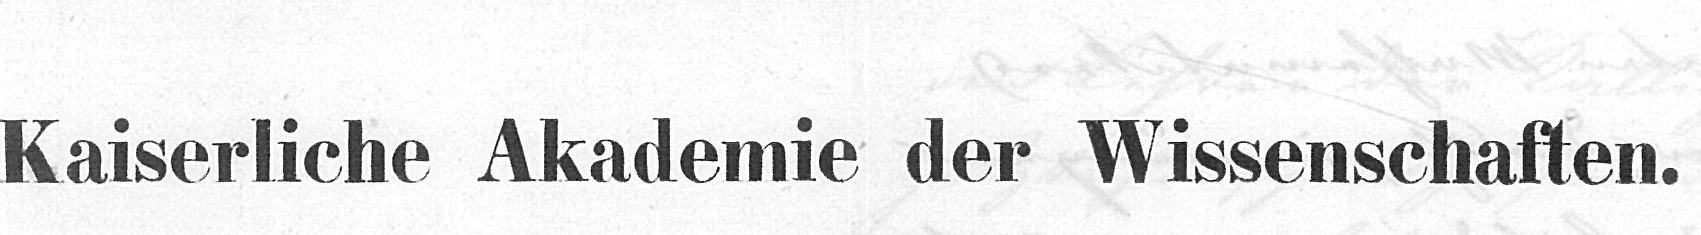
Kaiserliche Akademie der Wissenschaften.
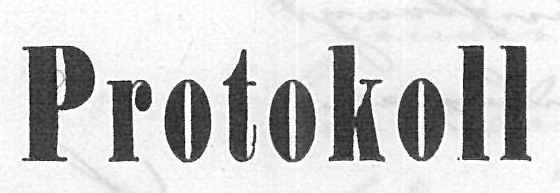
Protokoll
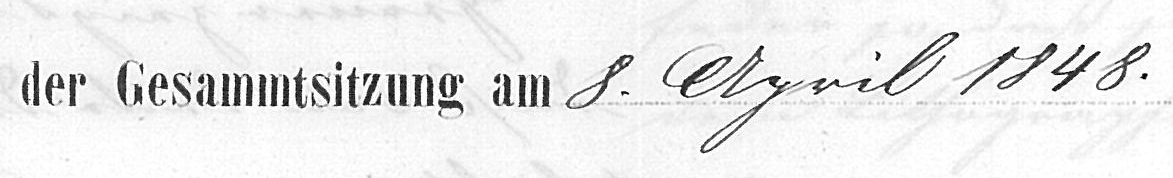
der Gesammtsitzung am 8. April 1848.
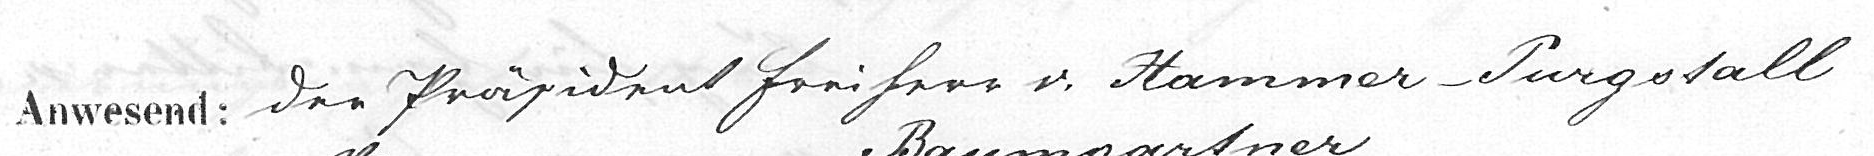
Anwesend: der Präsident Freiherr v. Hammer-Purgstall
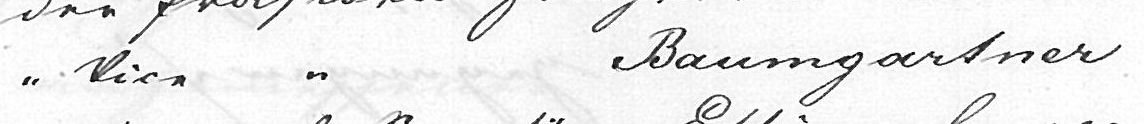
" Vice " Baumgartner
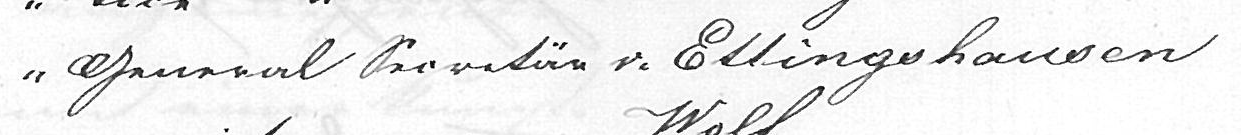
" General Secretär v. Ettingshausen
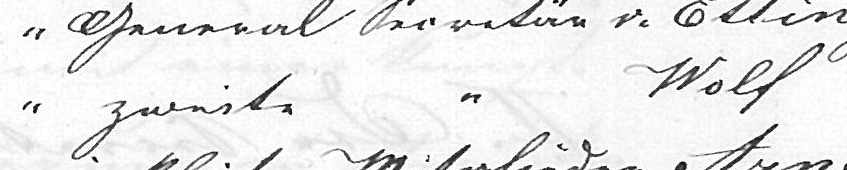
" zweite " Wolf
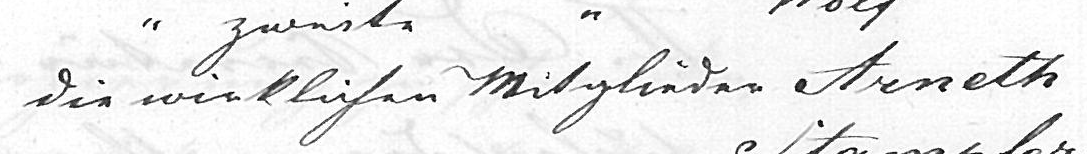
die wirklichen Mitglieder Arneth
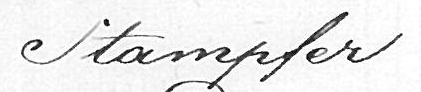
Stampfer
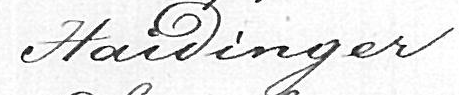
Haidinger
